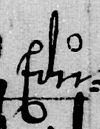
Di¬
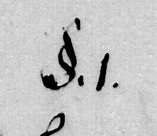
§.1.
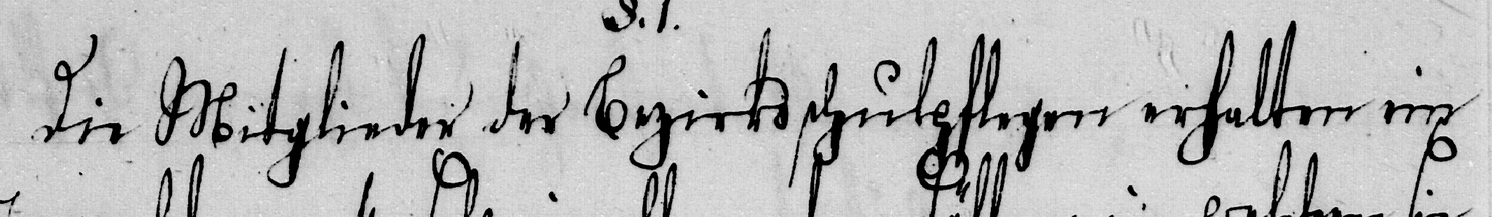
Die Mitglieder der Bezirksschulpflegen erhalten ein
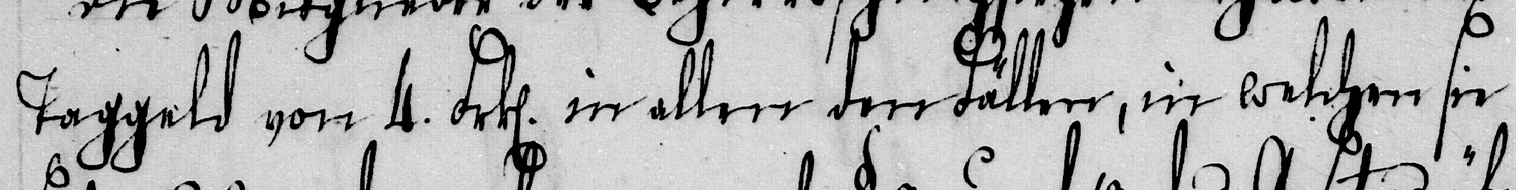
Taggeld von 4. Frk[en]. in allen den Fällen, in welchen sie
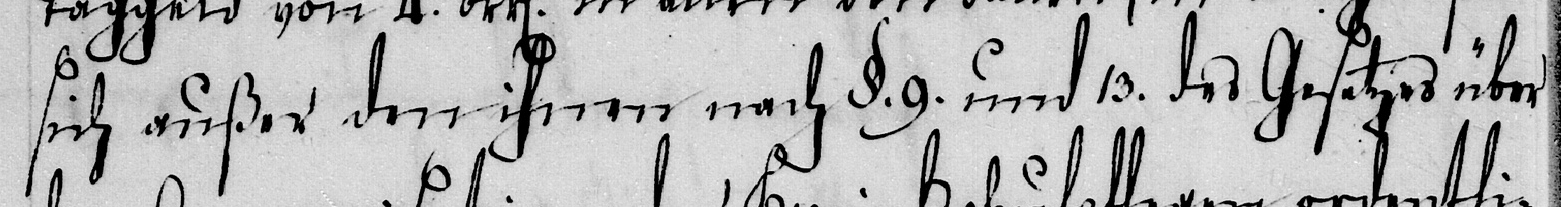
sich außer den ihnen nach §.9. und 13. des Gesetzes über
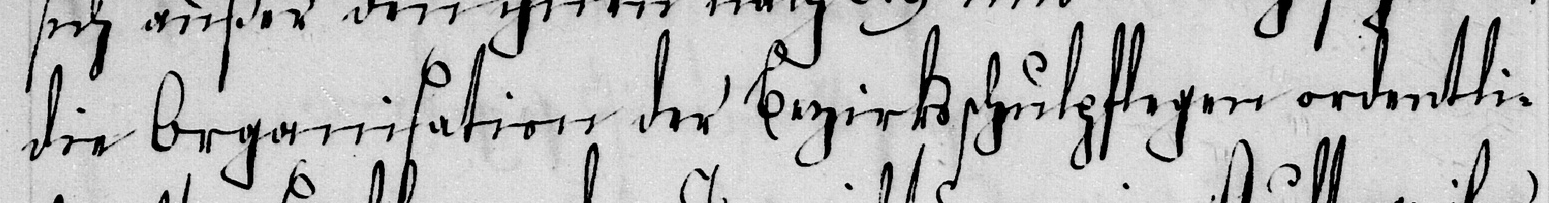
die Organisation der Bezirksschulpflegen ordentli¬
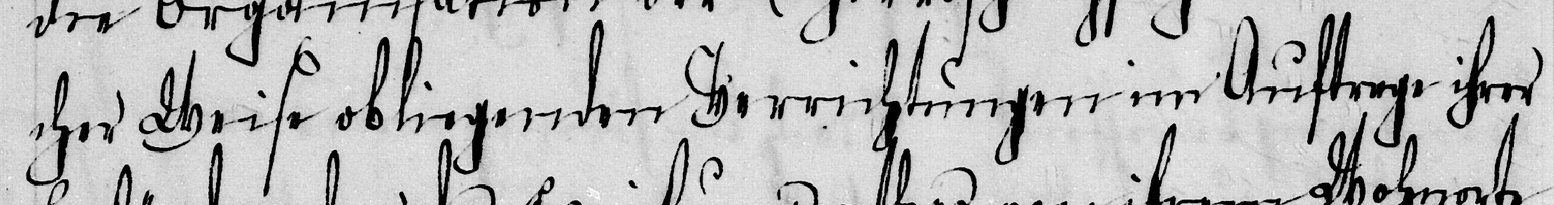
cher Weise obliegenden Verrichtungen im Auftrage ihrer
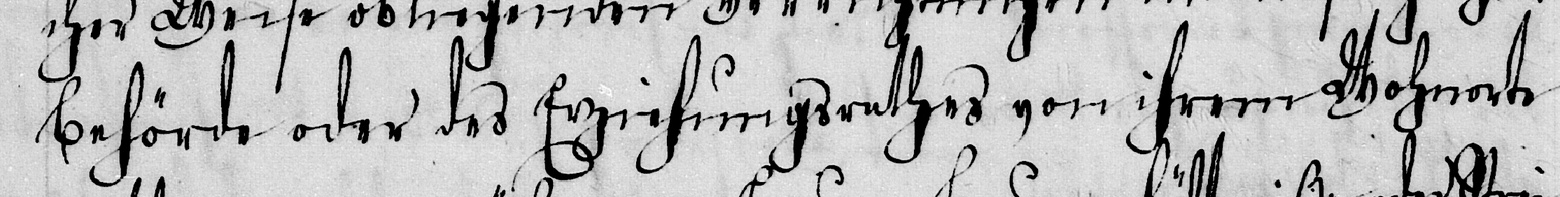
Behörde oder des Erziehungsrathes von ihrem Wohnorte
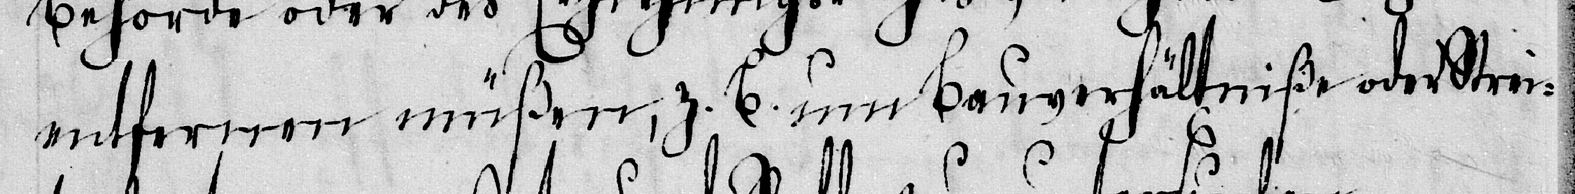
entfernen müßen, z.B. um Bauverhältniße oder Strei¬
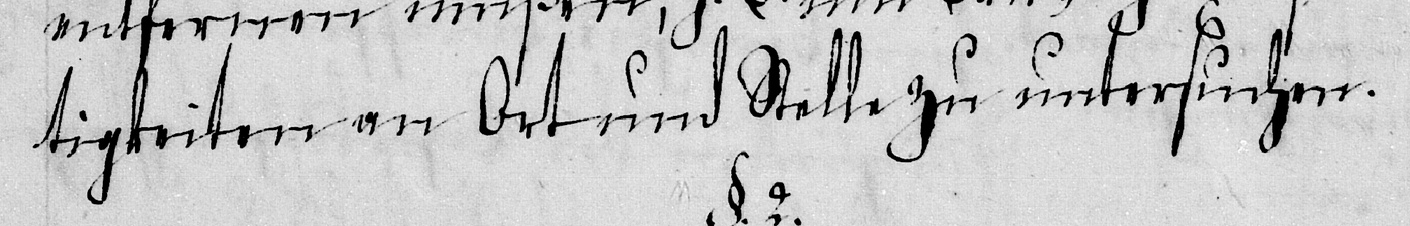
tigkeiten an Ort und Stelle zu untersuchen.
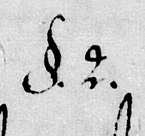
§.2.
